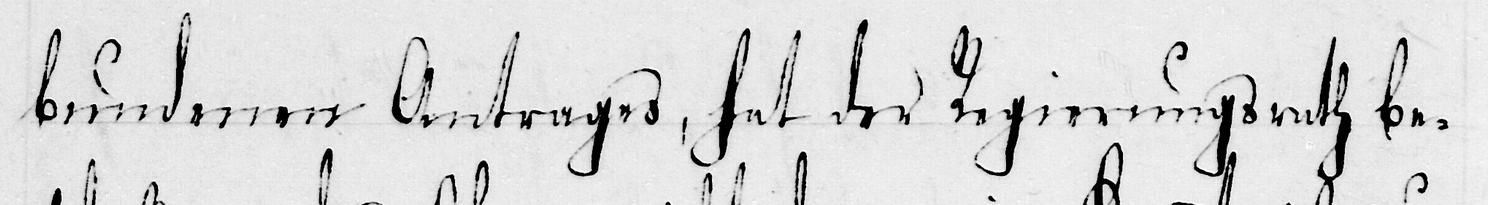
bundenen Antrages, hat der Regierungsrath be¬
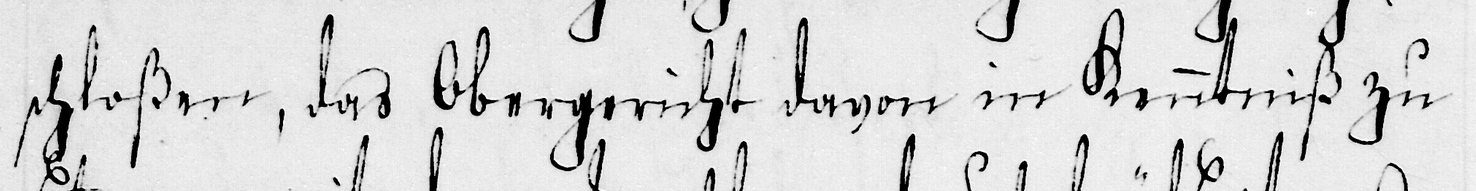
schloßen, das Obergericht davon in Kenntniß zu
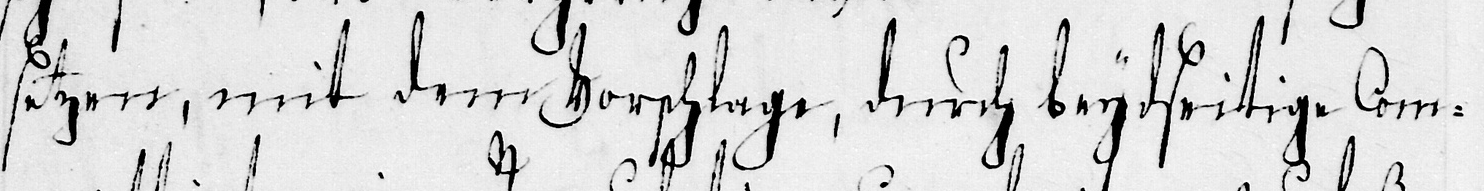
setzen, mit dem Vorschlage, durch beydseitige Com¬
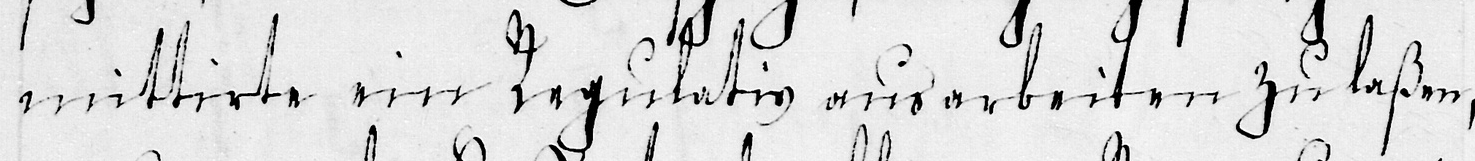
mittirte ein Regulativ ausarbeiten zu laßen,
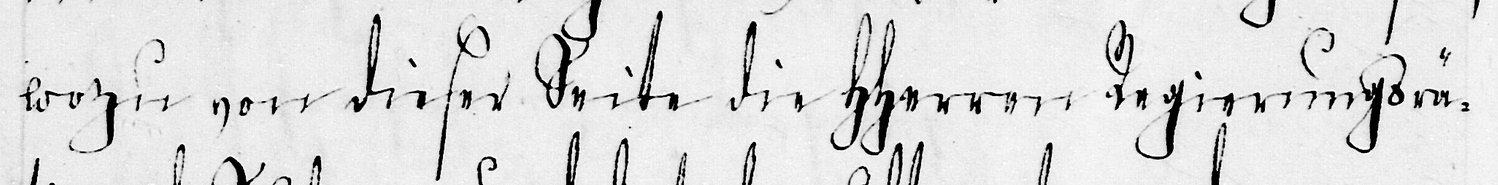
wozu von dieser Seite die HHerren Regierungsrä¬
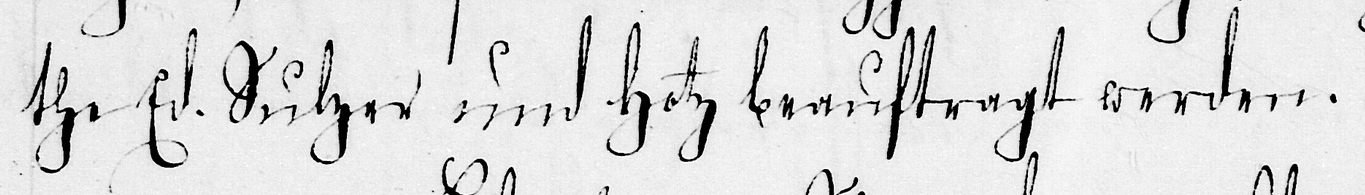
the Ed. Sulzer und Hotz beauftragt werden.
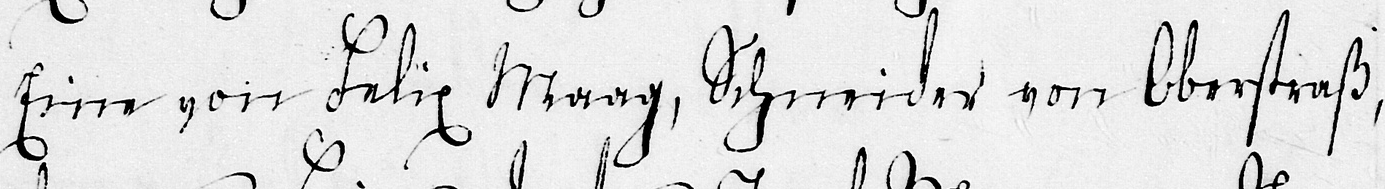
Eine von Felix Maag, Schneider von Oberstraß,
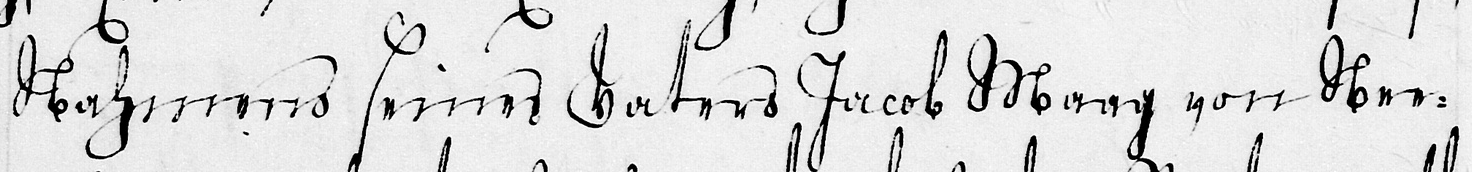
Nahmens seines Vaters Jacob Maag von Nee¬
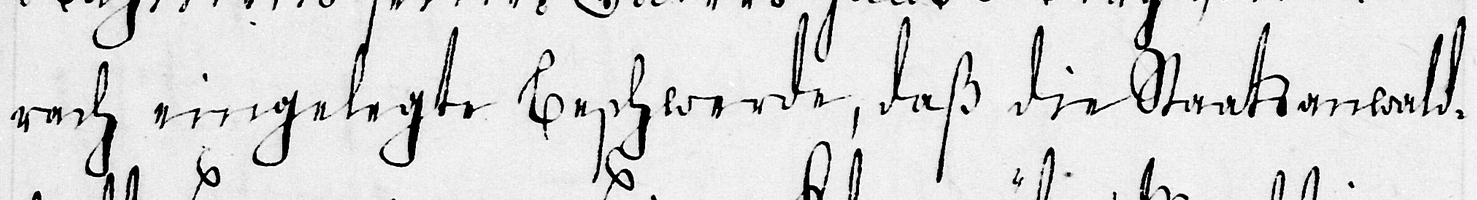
rach eingelegte Beschwerde, daß die Staatsanwald¬
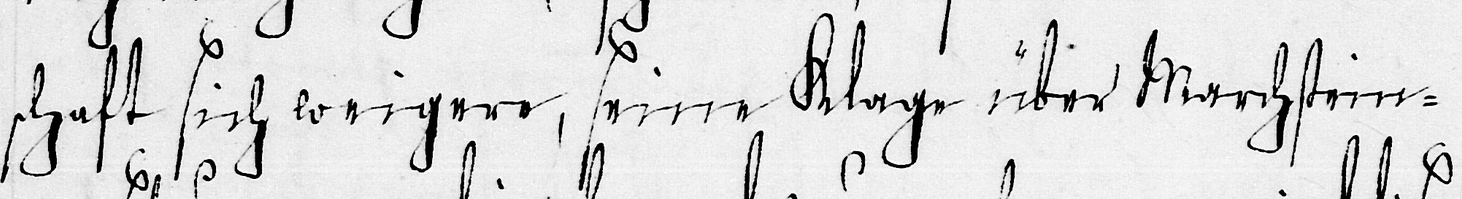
schaft sich weigere, seine Klage über Marchstein¬
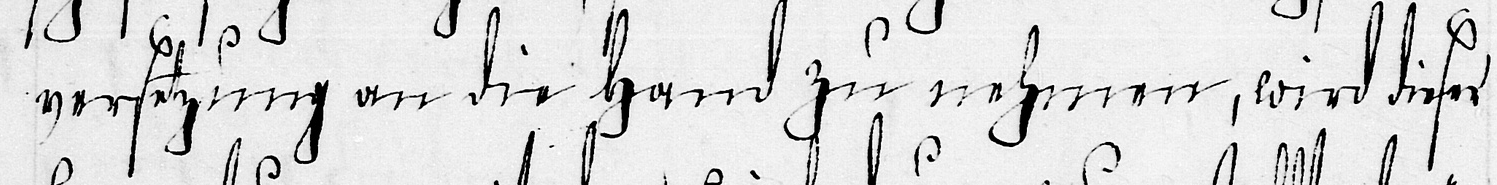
versetzung an die Hand zu nehmen, wird dieser
